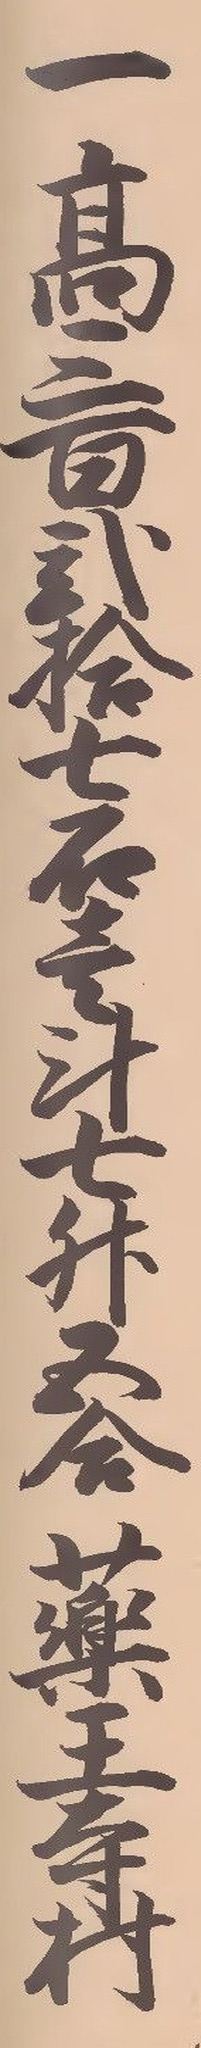一高三百弐拾七石壱斗七升五合薬王寺村
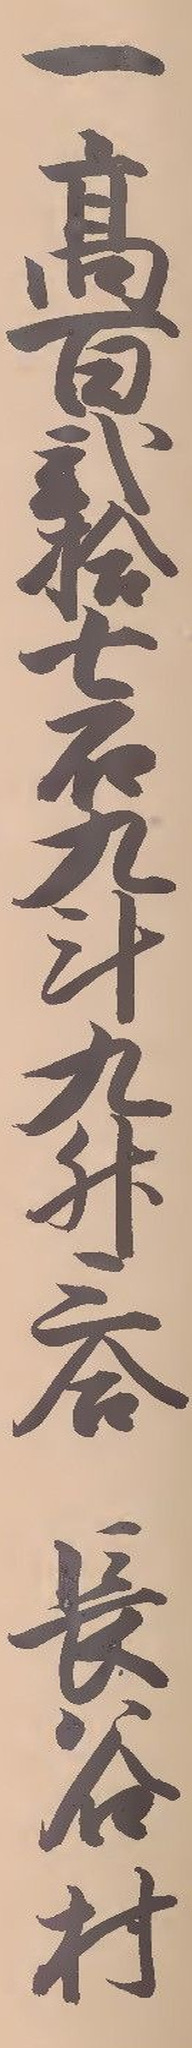一高百弐拾七石九斗九升三合長谷村
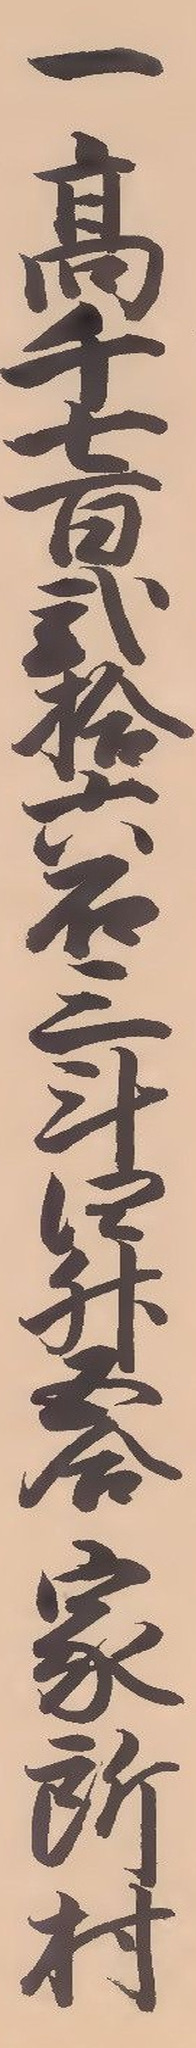一高千七百弐拾六石三斗四升五合家所村
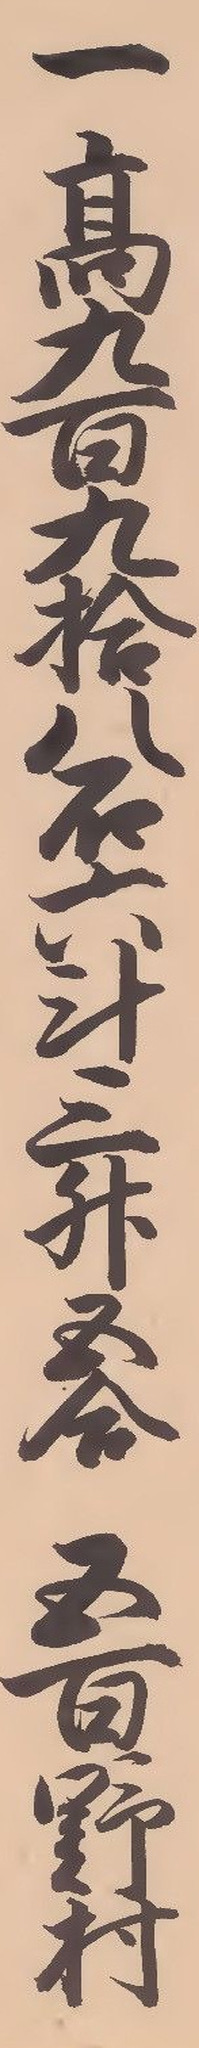一高九百九拾八石六斗三升五合五百野村
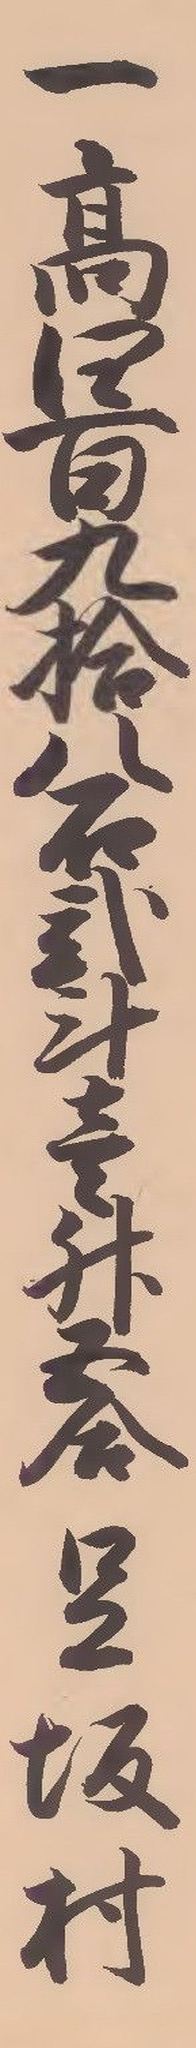一高四百九拾八石弐斗壱升五合足坂村

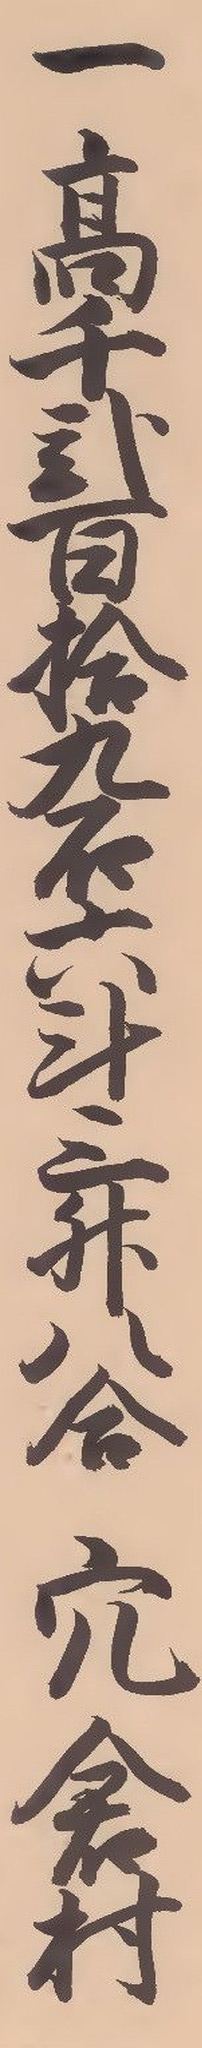一高千弐百拾九石六斗三升八合穴倉村
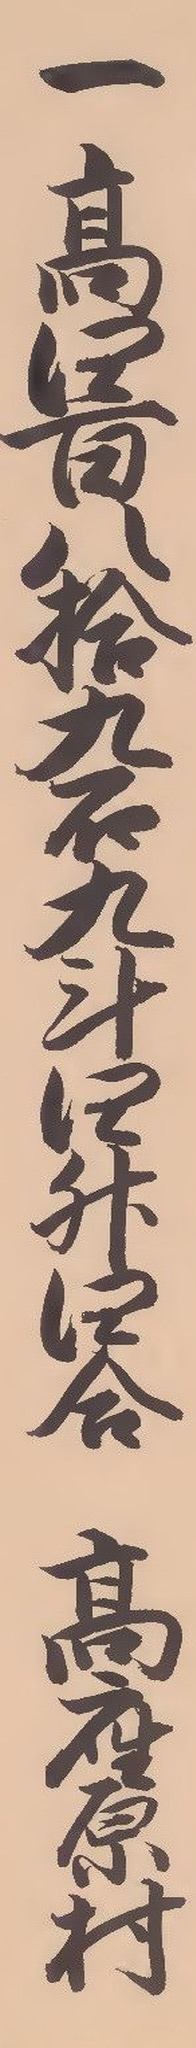一高四百八拾九石九斗四升四合高座原村
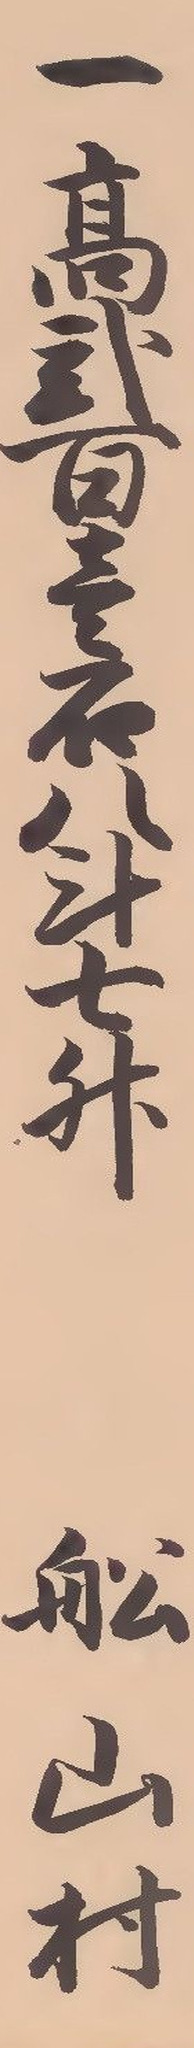一高弐百壱石八斗七升船山村
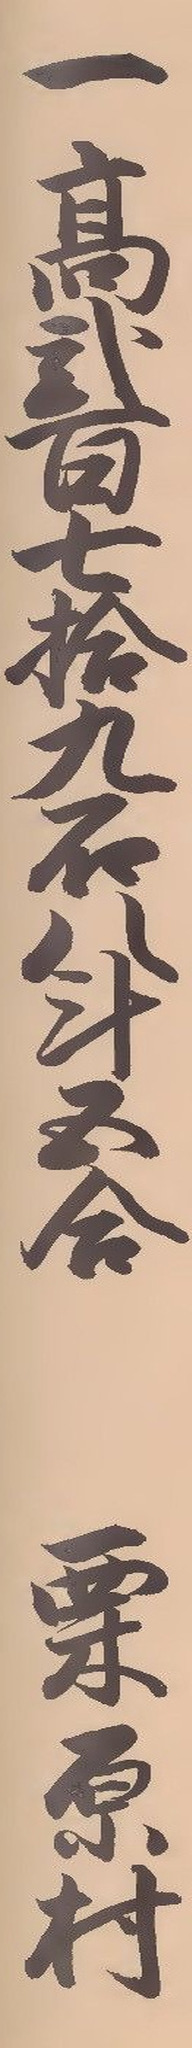一高弐百七拾九石八斗五合栗原村
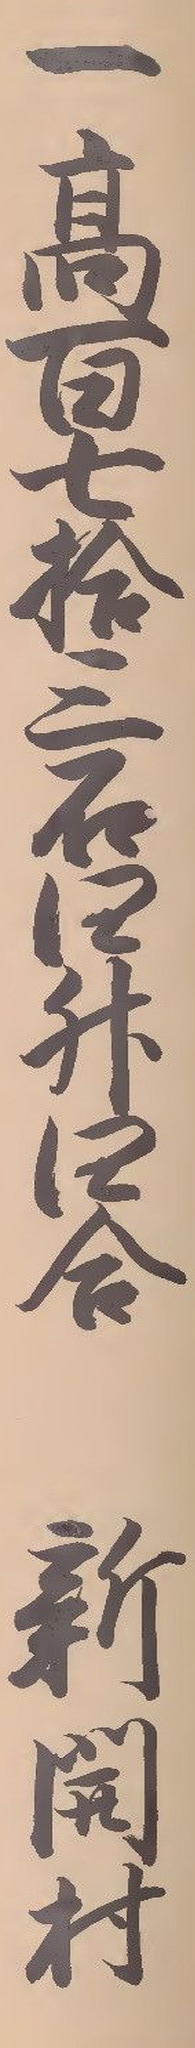一高百七拾三石四升四合新開村
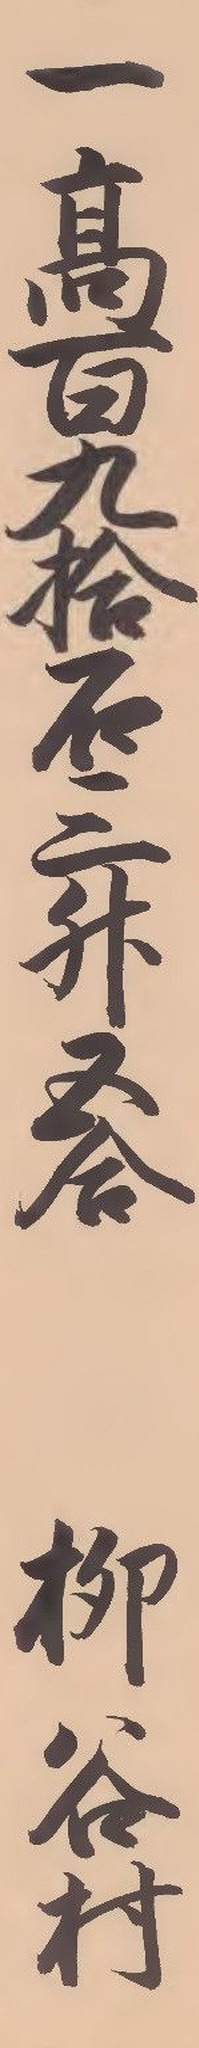一高百九拾石三升五合柳谷村
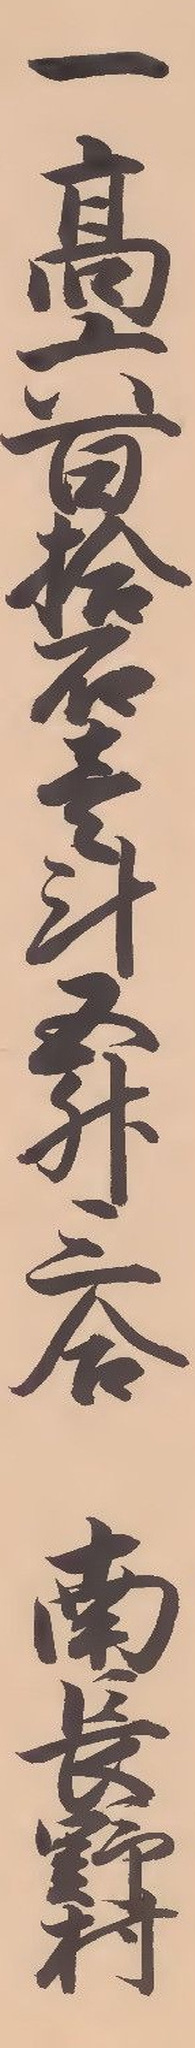一高六百拾石壱斗五升三合南長野村
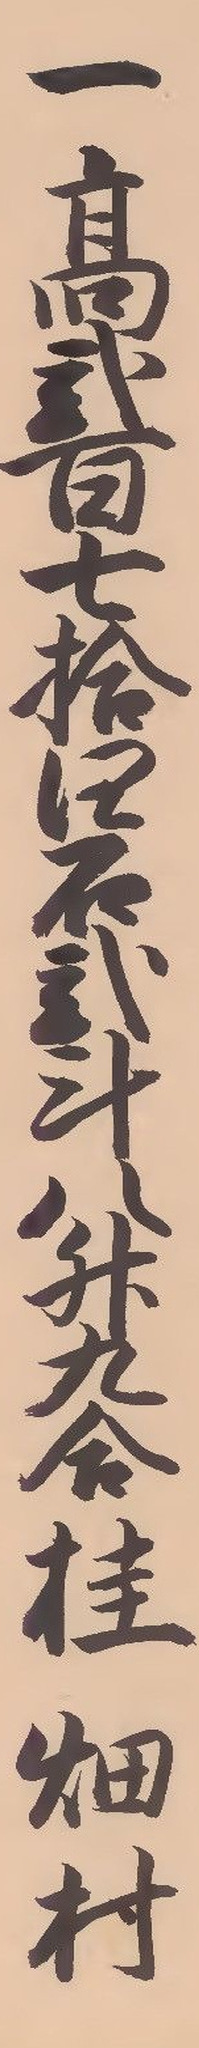一高弐百七拾四石弐斗八升九合桂畑村

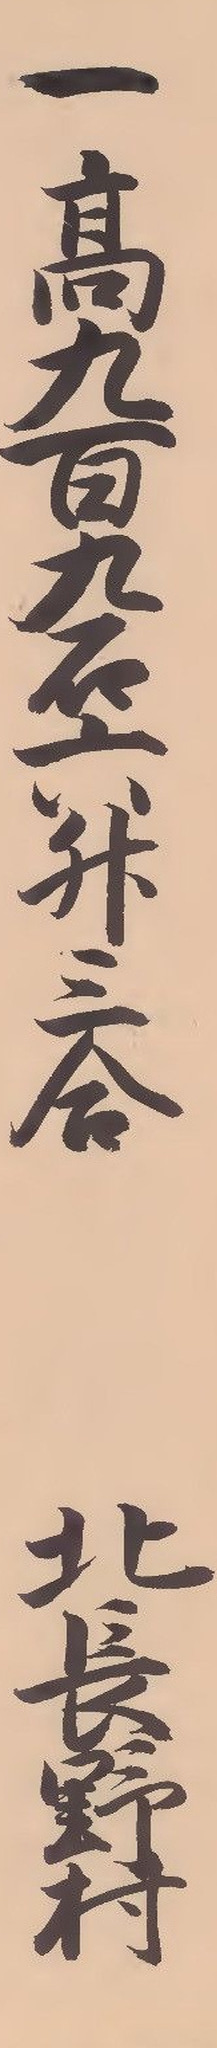一高九百九石六升三合北長野村
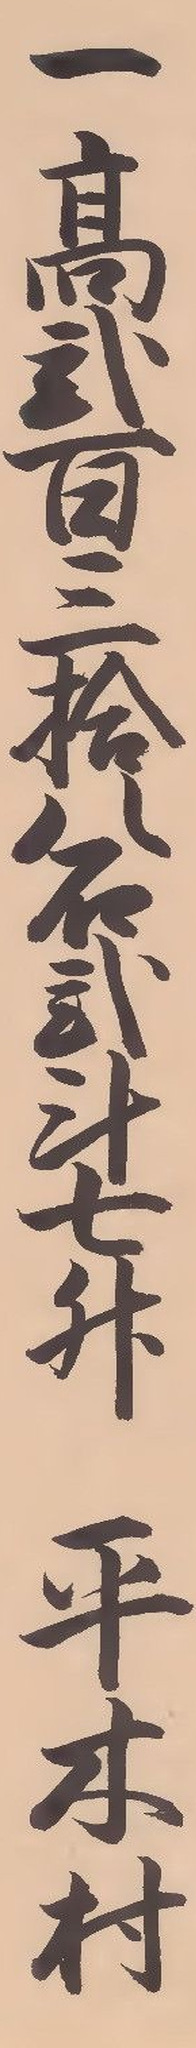一高弐百三拾八石弐斗七升平木村
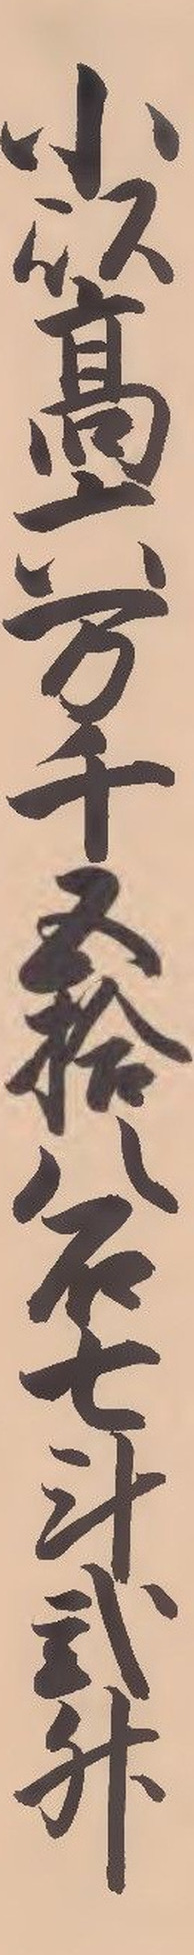小以高六万千五拾八石七斗弐升
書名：伊勢国郷帳
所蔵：国立公文書館 National Archives of Japan
